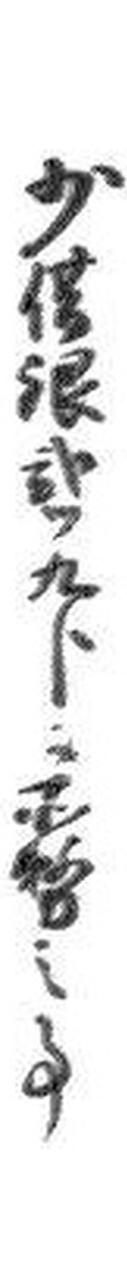少借銀弐ッ九分ニ而所務之事
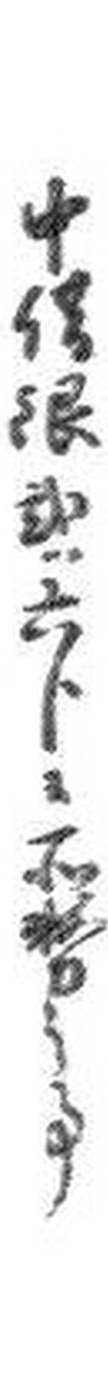中借銀弐ッ六分ニ而所務之事
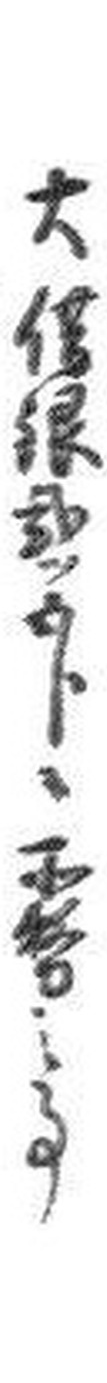大借銀弐ッ六分に所務之事
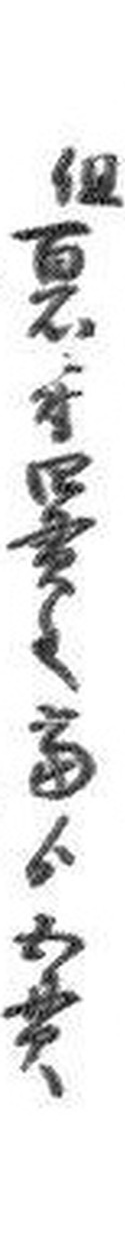但百石ニ付四貫匁当ゟ五貫
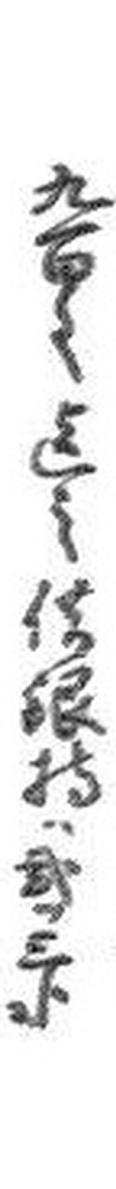九百匁迄之借銀持は弐ッ三分ニ
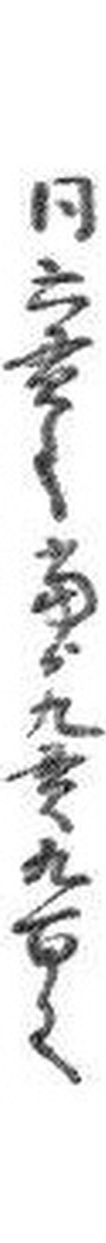同六貫匁当ゟ九貫九百匁
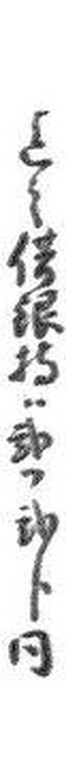迄之借銀持は弐ッ弐分同
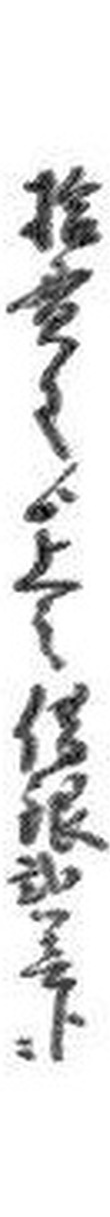拾貫匁ゟ上之借銀弐ッ壱分ニ
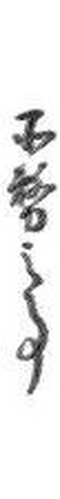所務之事
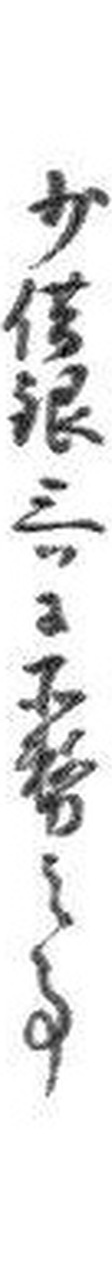少借銀三ッに所務之事
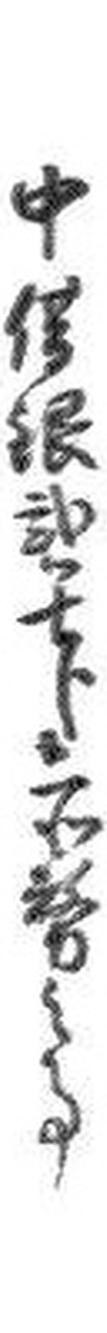中借銀弐ッ七分ニ而所務之事
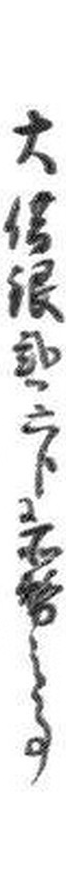大借銀弐ッ六分に所務之事
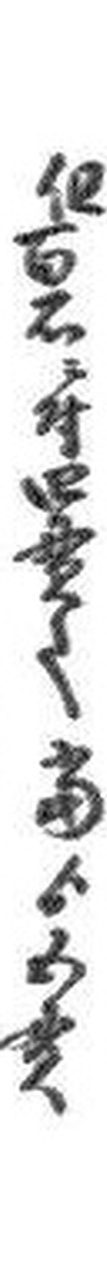但百石ニ付四貫匁当ゟ五貫
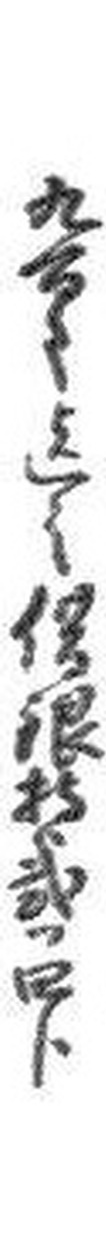九百匁迄之借銀持は弐ッ四分
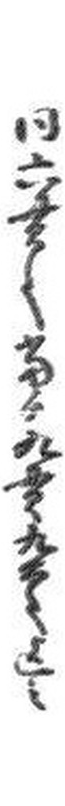同六貫匁当ゟ九貫九百匁迄之

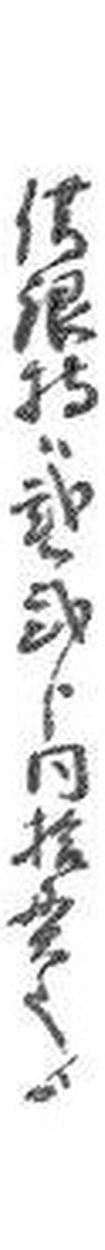借銀持は弐ッ弐分同拾貫匁ゟ
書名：家譜 八 光通公 従寛文十年到同十二年
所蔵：福井県文書館 Fukui Prefectural Archives
